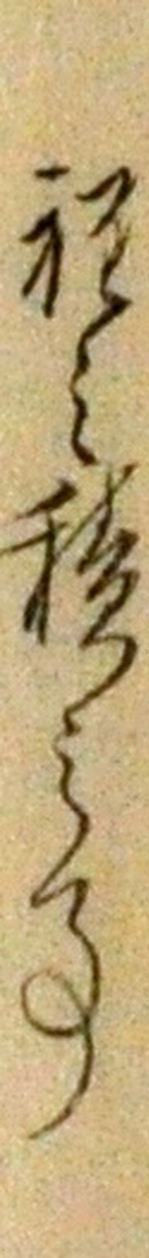程之積之事
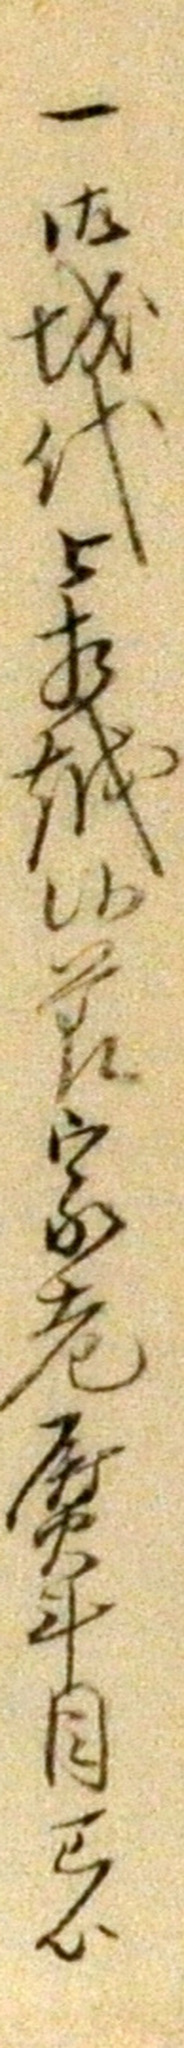一御城代被相越候節家老熨斗目着
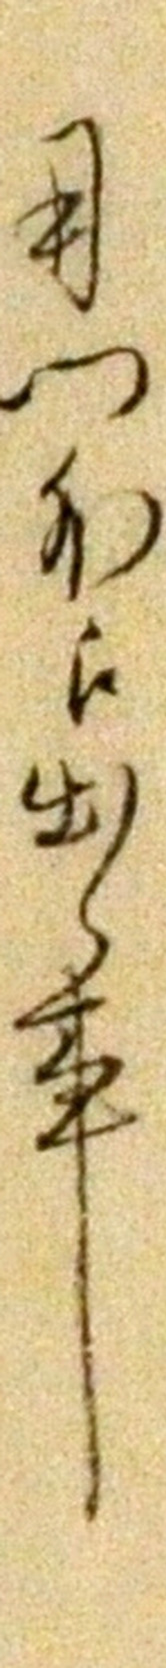用門外江出候事
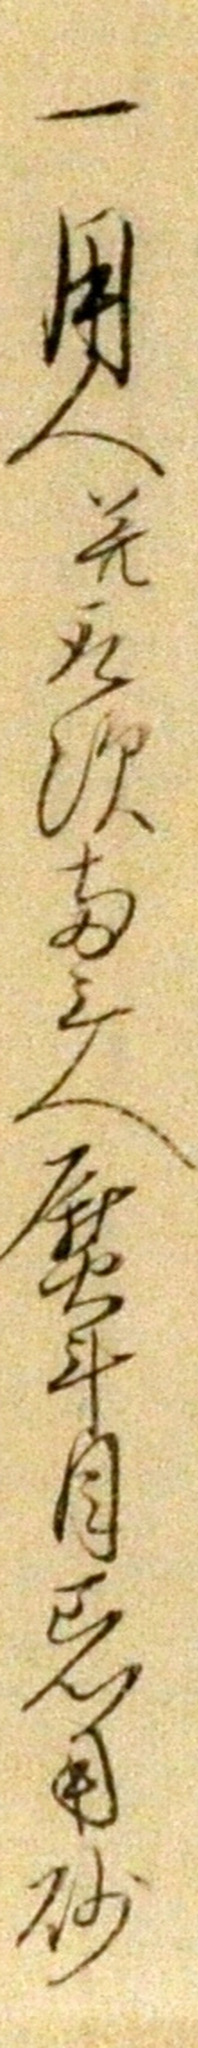一用人并取次両三人熨斗目着用砂
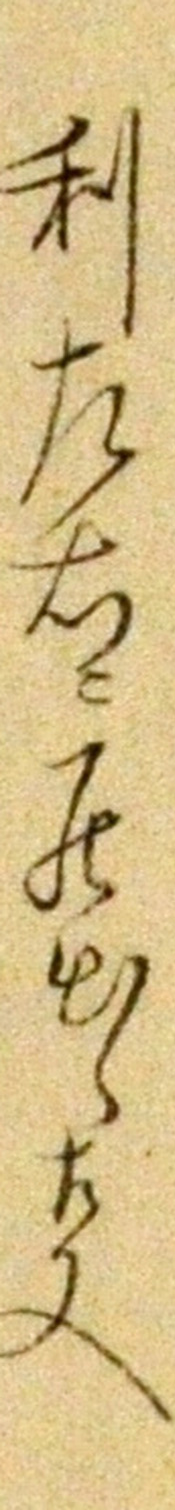利左右ニ罷出候事
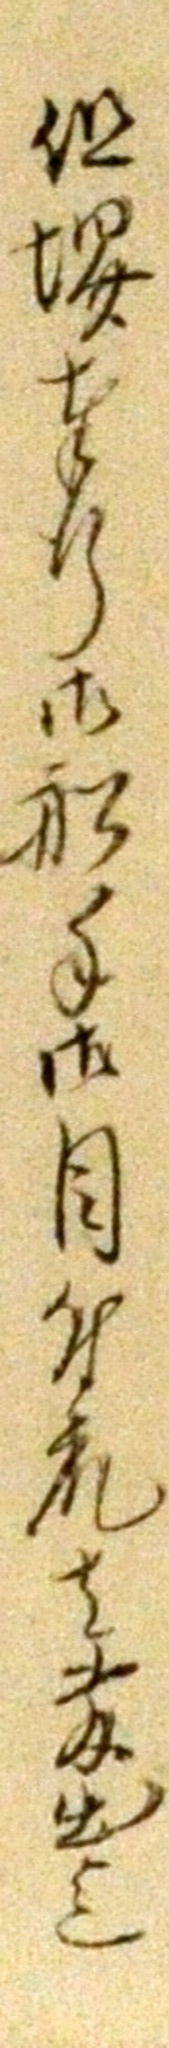但堺奉行御船手御目付衆者敷出迄
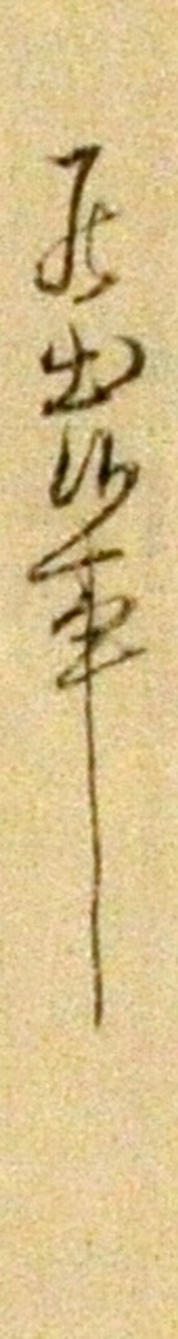罷出候事
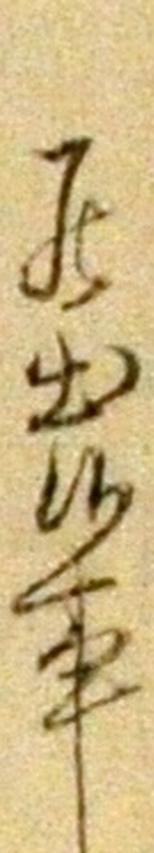罷出候事
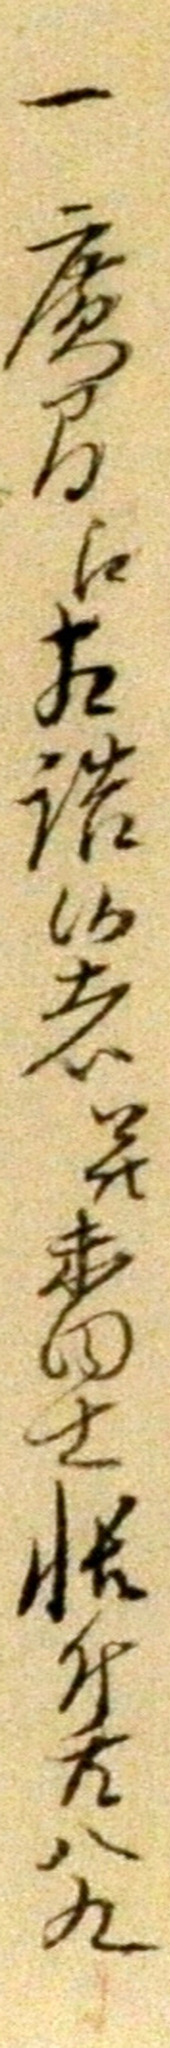一広間江相詰候者并番士帳付共八九
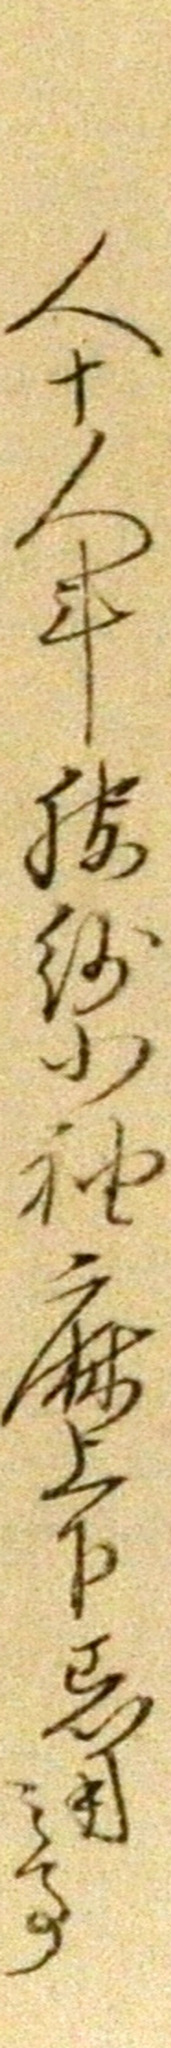人十人計服紗小袖麻上下着用之事
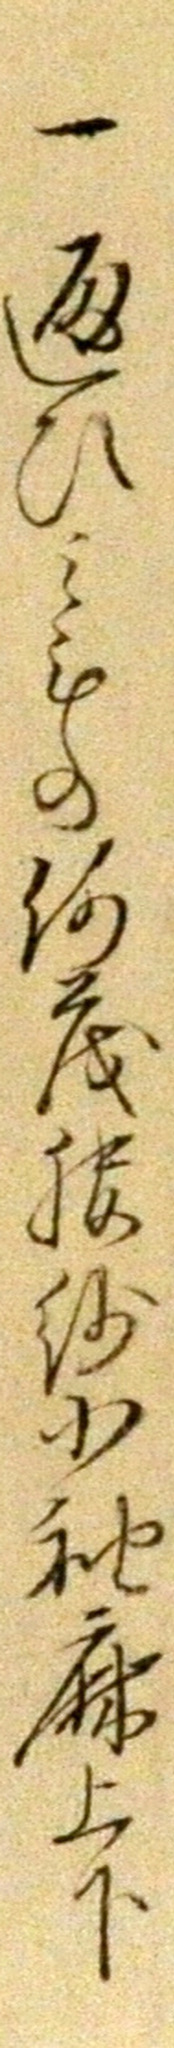一通ひ之もの何も服紗小袖麻上下
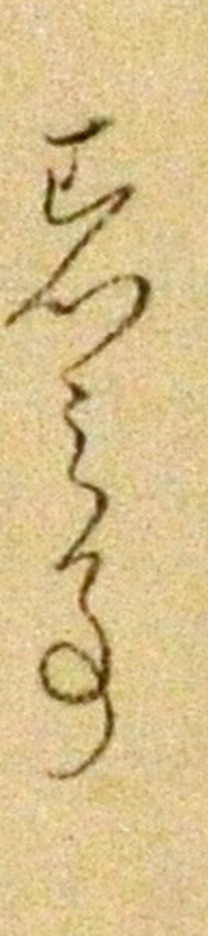着之事
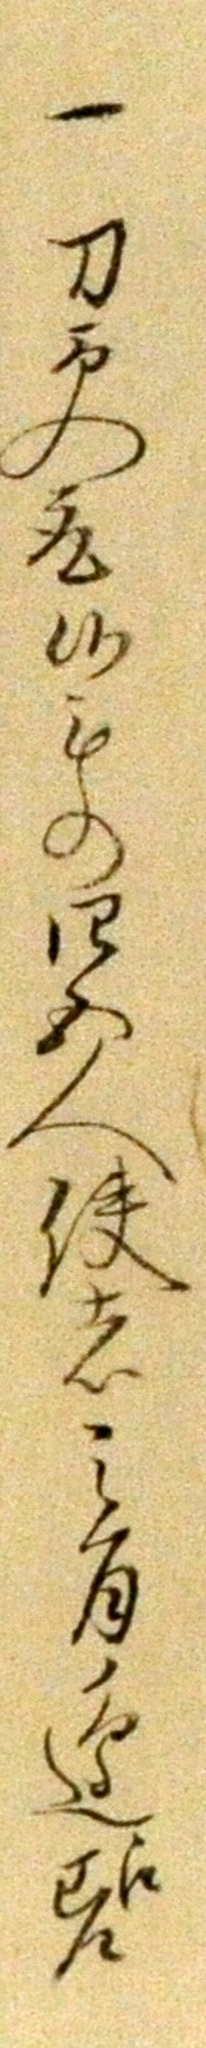一刀受取候もの四五人使者之間辺江差
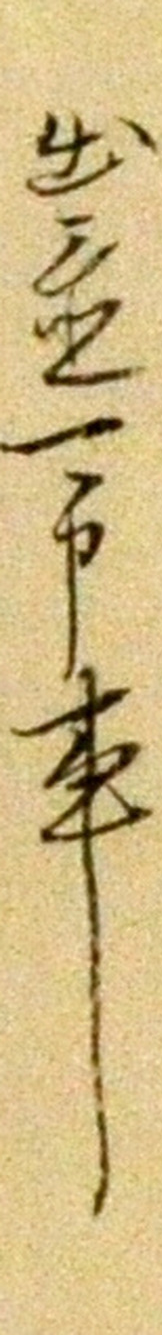出置可申事
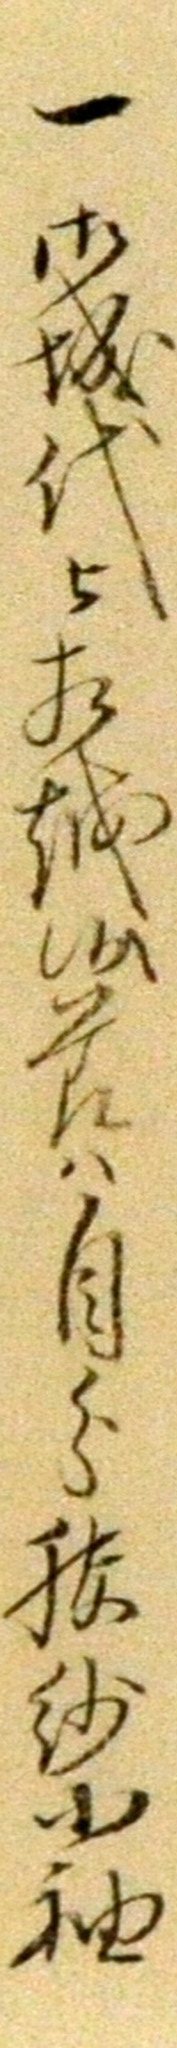一御城代被相越候節ㇵ自分服紗小袖
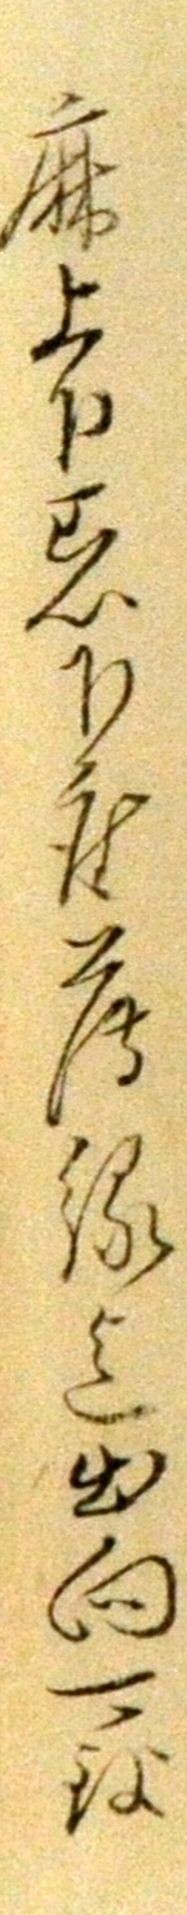麻上下着下座薄縁迄出向可致
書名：大阪加番関係諸書留〔一括〕
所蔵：伊那市立高遠町図書館・合同会社AMANE
